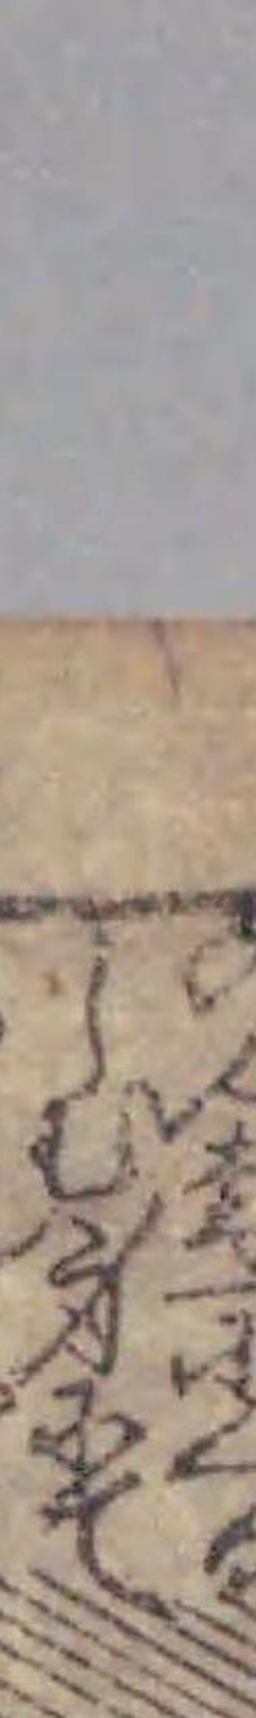しむ身にて
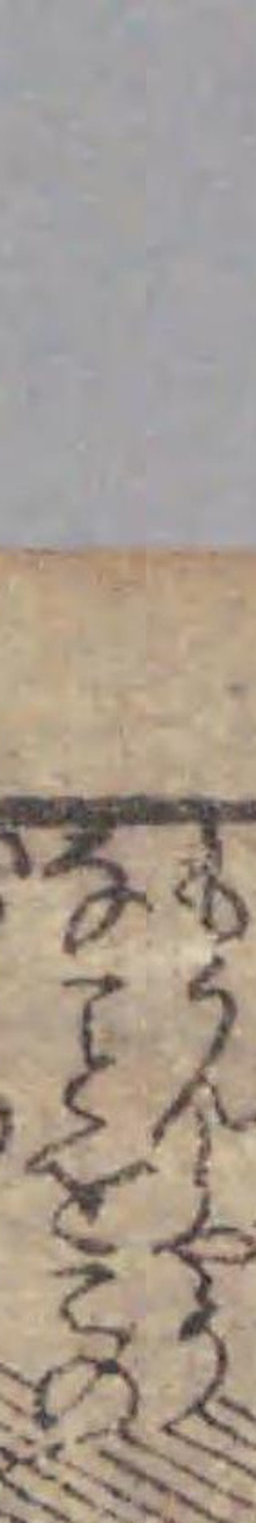なことをこの
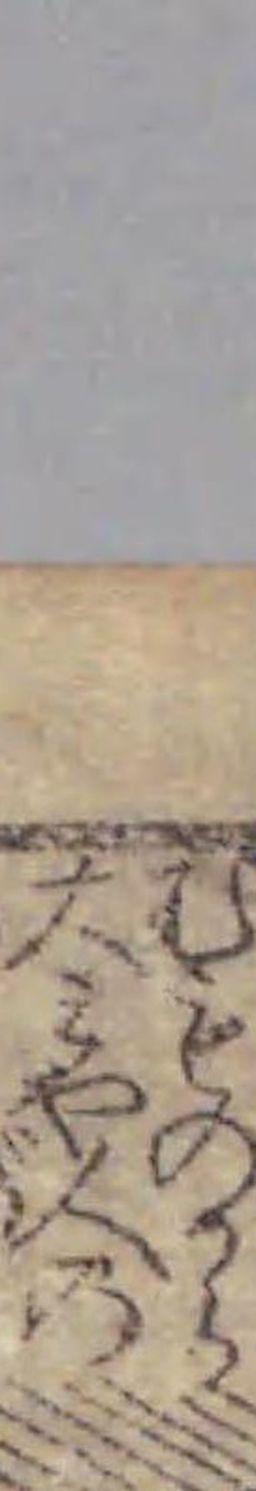大みや人の
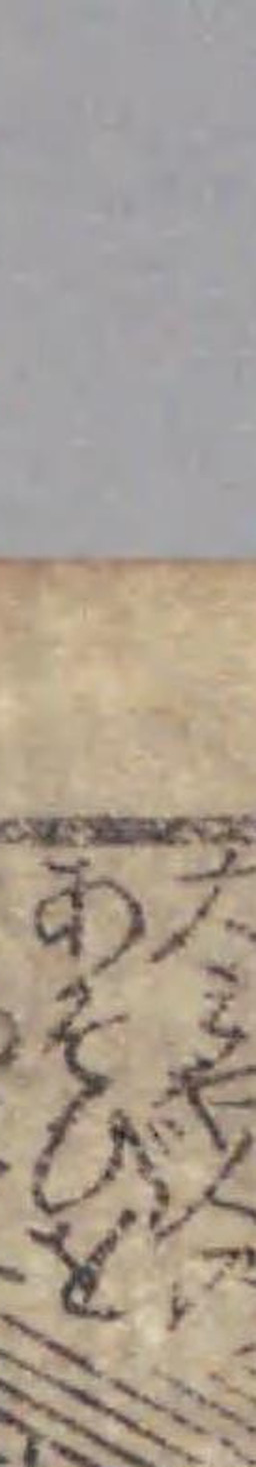あそびを
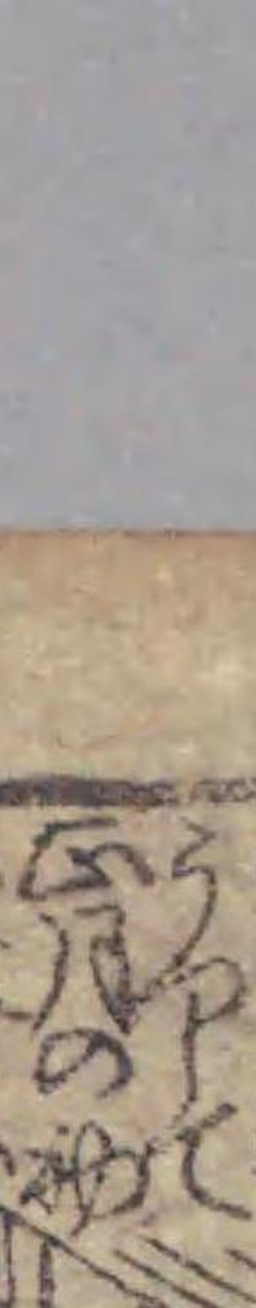正月の初
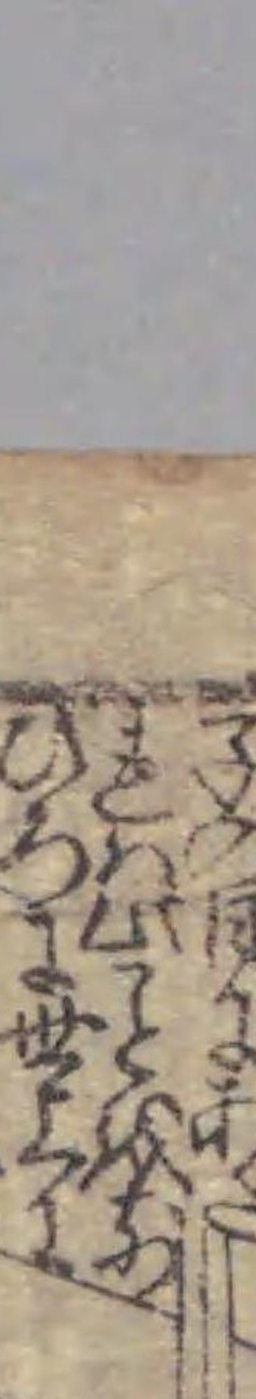ひろに世上に
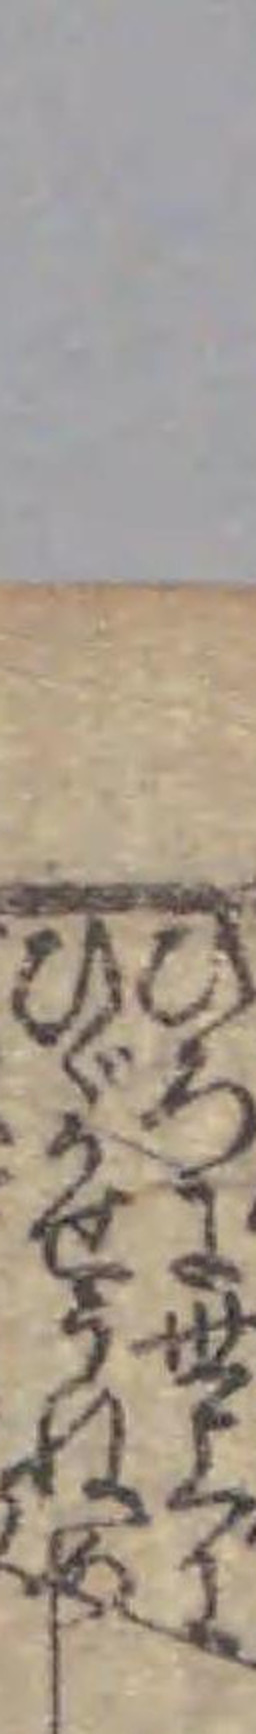ひゞかせうねめ
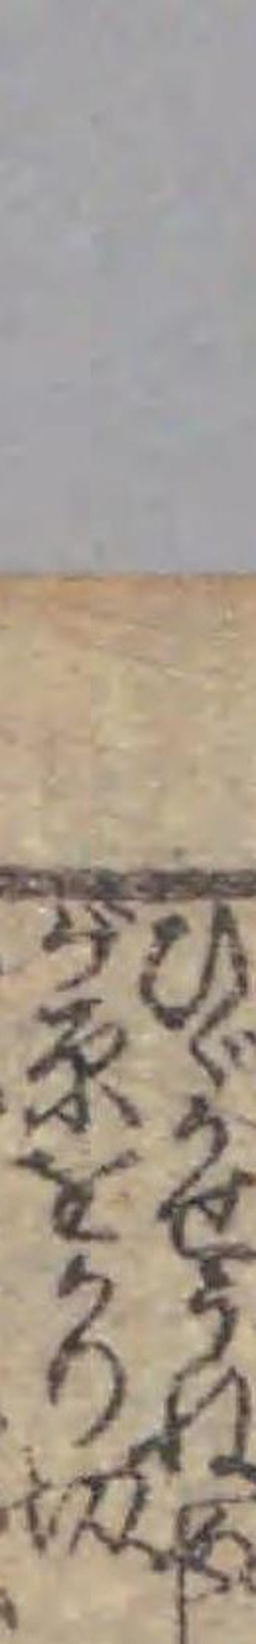が原をかり切
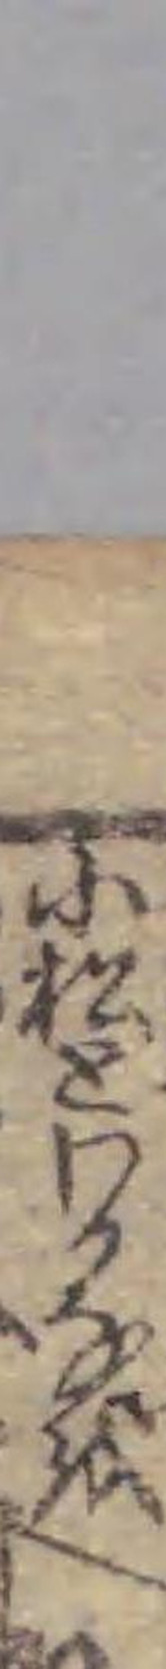小松とわかなを
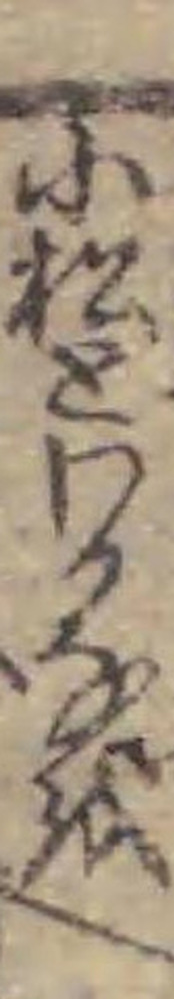小松とわかなを
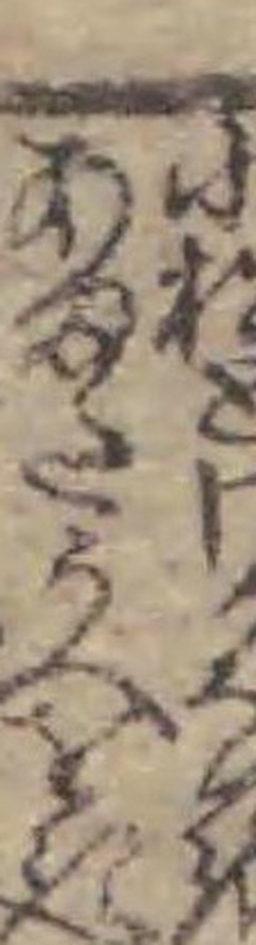あまたうへをき
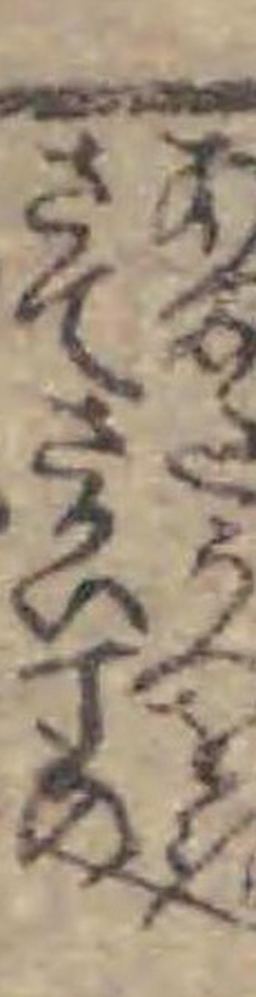さてさかい丁の
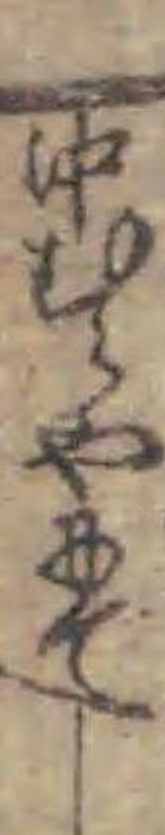中むらやにて
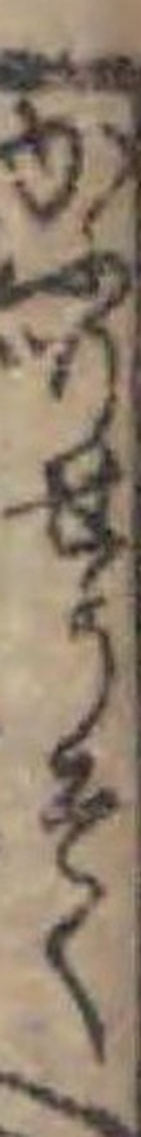かふりせうそく
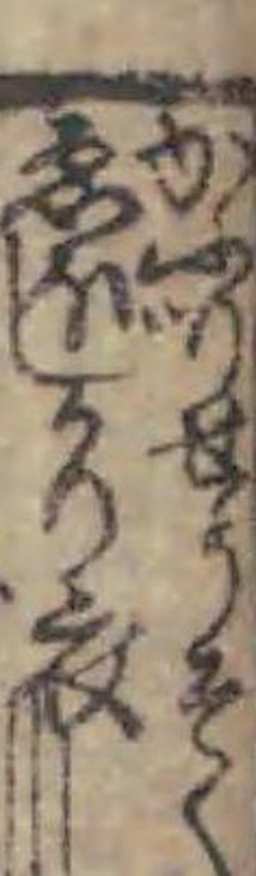ゑぼしかり衣
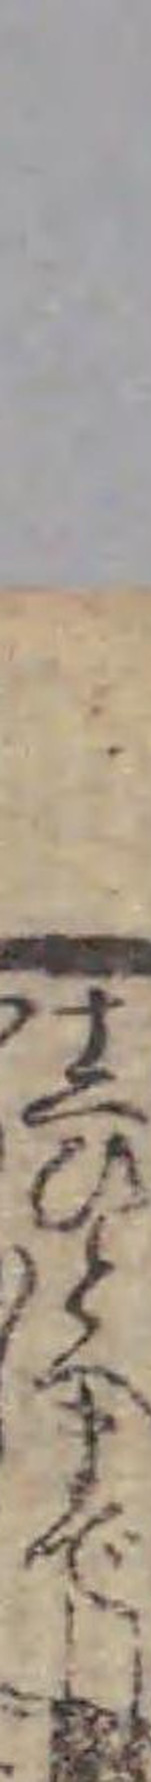十二ひとへまで
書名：本樹真猿浮気噺 : 3巻
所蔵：国立国会図書館 National Diet Library, JAPAN
